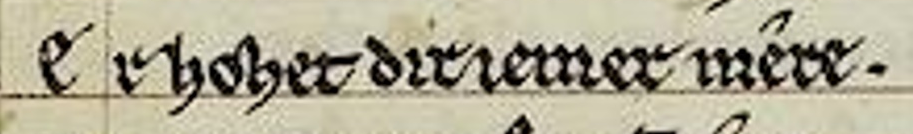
Er hohet dir iemer mere.
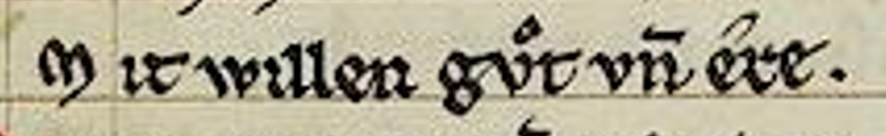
Mit willen gv°ot vn(d) ere.
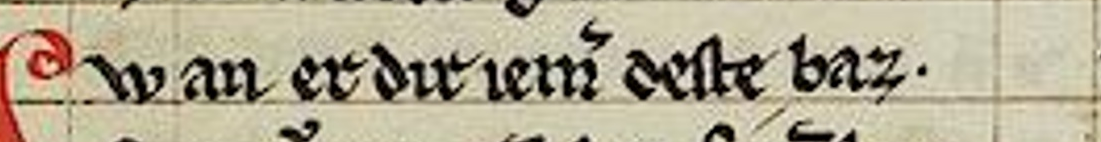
Wan er dir iem(er) deſte baz.
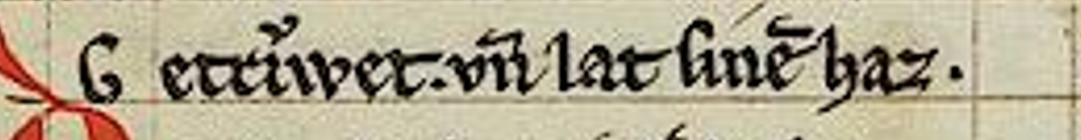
Getri°vwet. vn(d) lat ſine(n) haz.
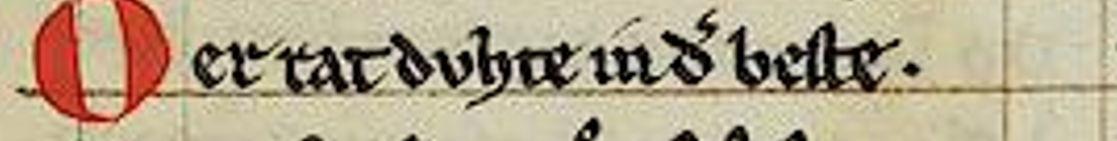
*Der rat dvhte in d(er) beſte.
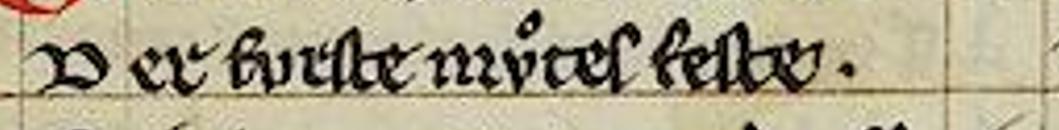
Der fvrſte mv°oteſ feſte.
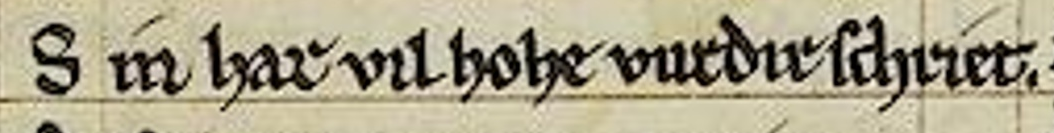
Sin har vil hohe vurdir ſchriet.
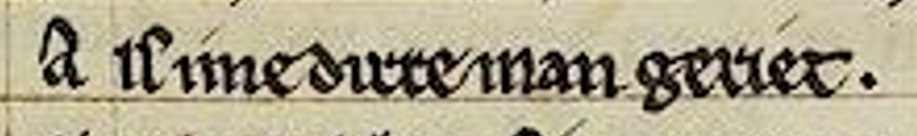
Alſ ime dirre man geriet.
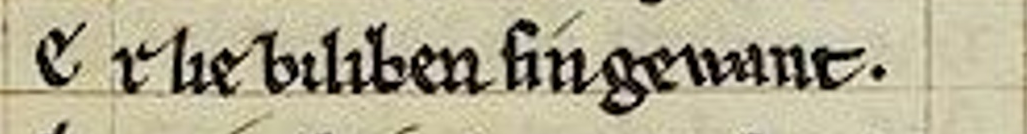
Er lie biliben ſin gewant.
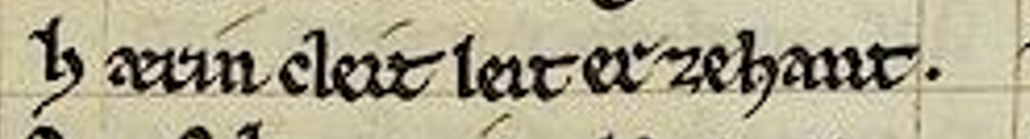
H[ae]rin cleit leit er zehant.
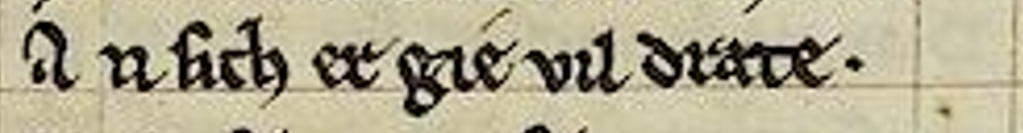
An ſich er gie vil drate.
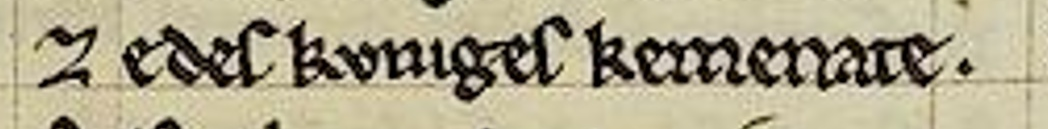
Ze deſ kvnigeſ kemenate.
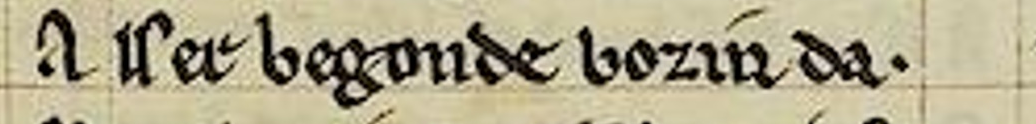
Alſ er begonde bozin da.
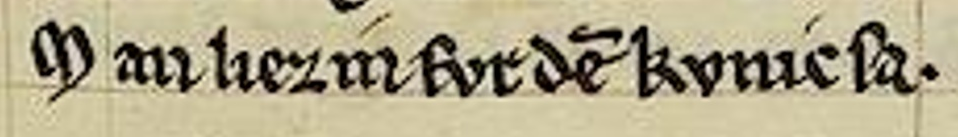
Man liez in fvr de(n) kvnic ſa.
